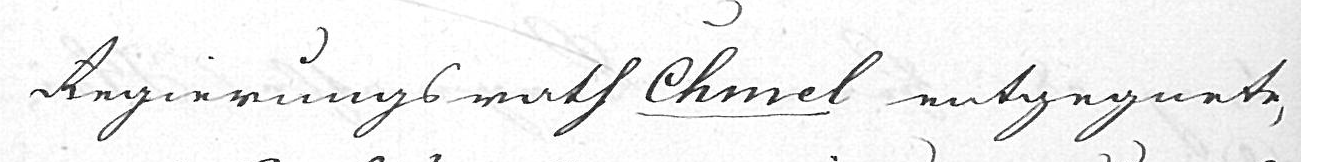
Regierungsrath Chmel entgegnete,
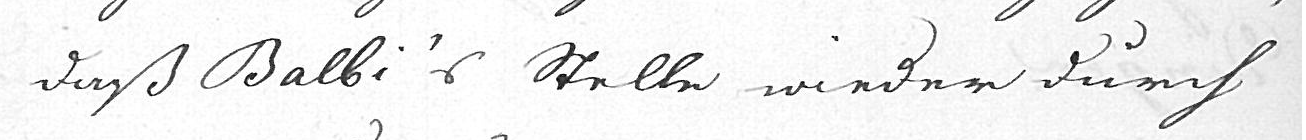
daß Balbi's Stelle wieder durch
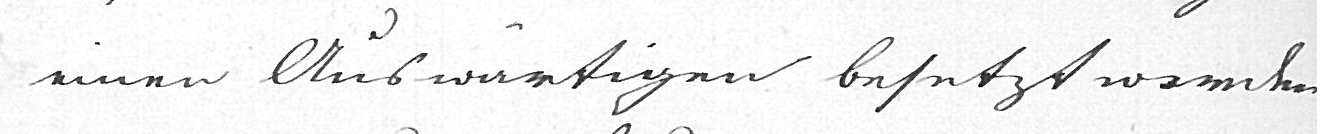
einen Auswärtigen besetzt werden
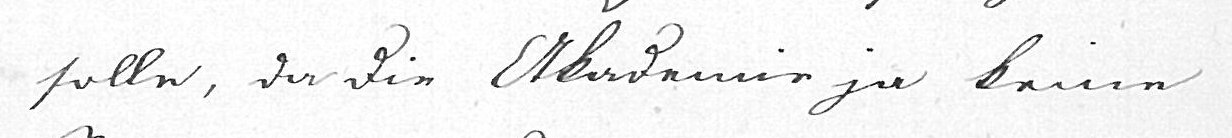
solle, da die Akademie ja keine
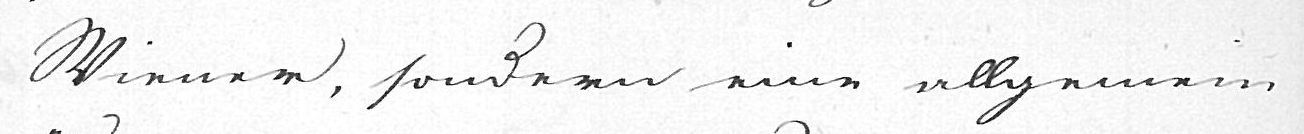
Wiener, sondern eine allgemeine
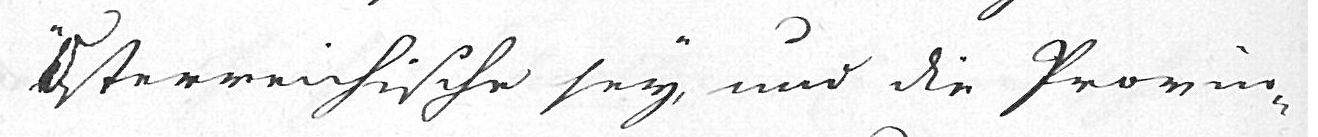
Österreichische sey, und die Provin-
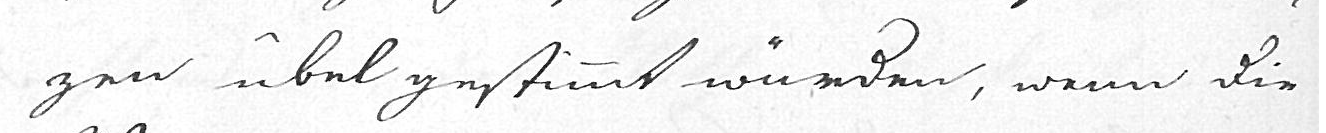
zen übel gestimmt würden, wenn die
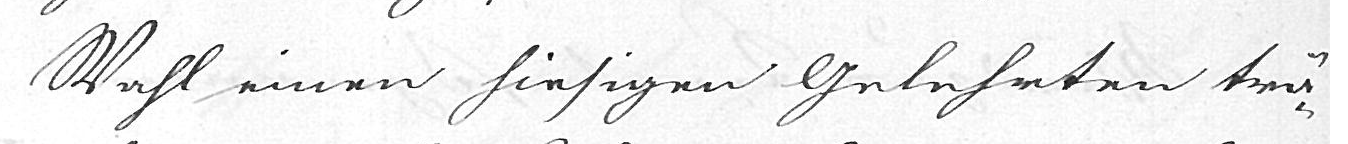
Wahl einen hiesigen Gelehrten trä-
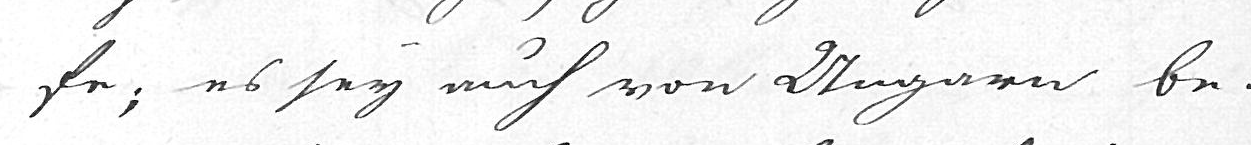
fe; es sey auch von Ungarn be-
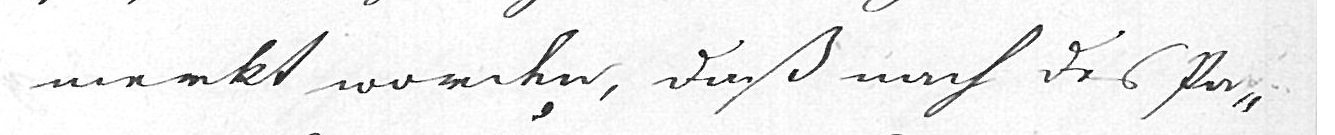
merkt worden, daß nach des Pa-
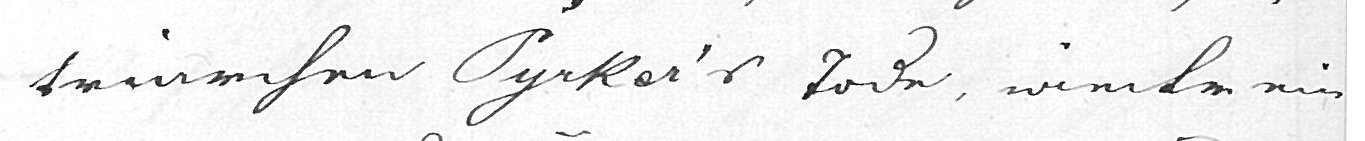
triarchen Pyrker's Tode, wieder ein
